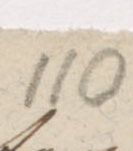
98.
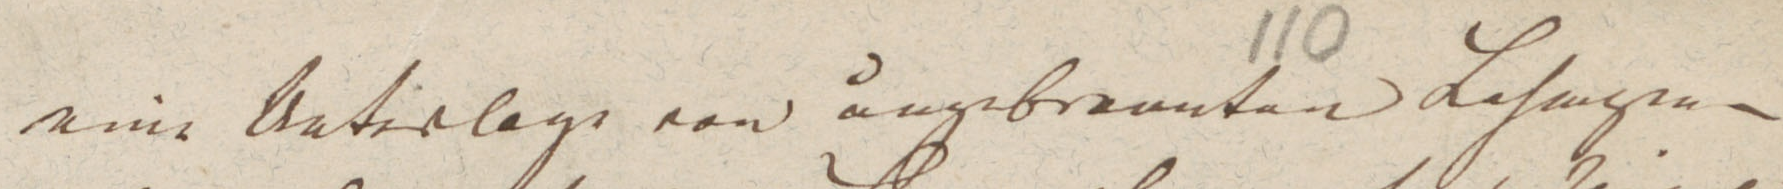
eine Unterlage von ungebrannten Lehmzie-
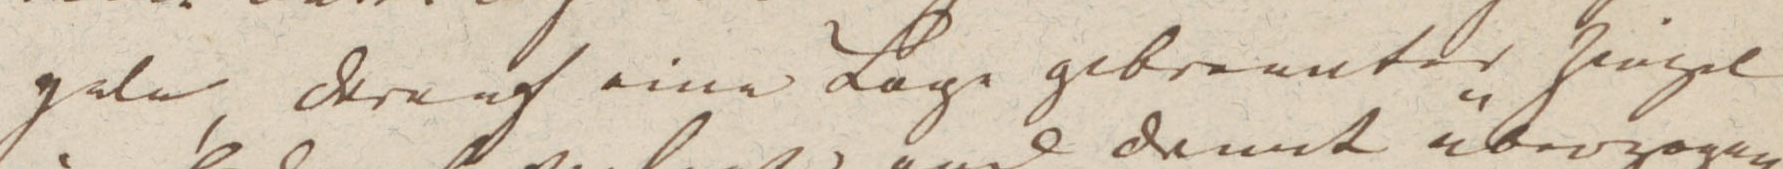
geln, darauf eine Lage gebrannter Ziegel
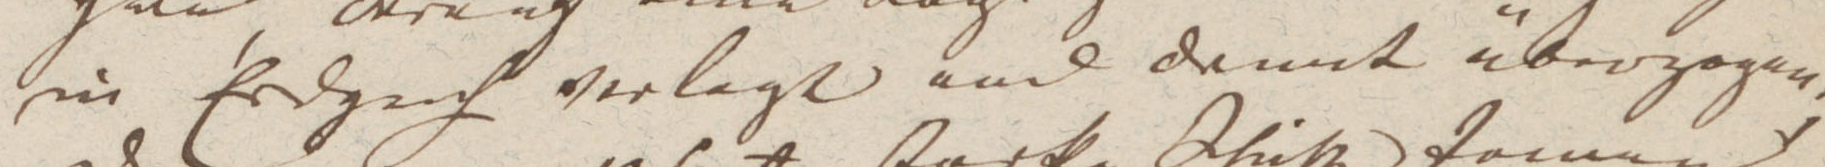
in Erdpech verlegt und damit überzogen.
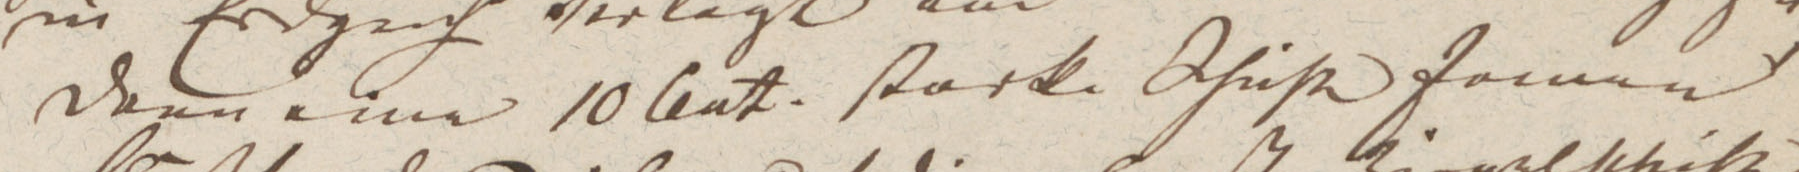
Dann eine 10 Cent. starke Schicht feinen
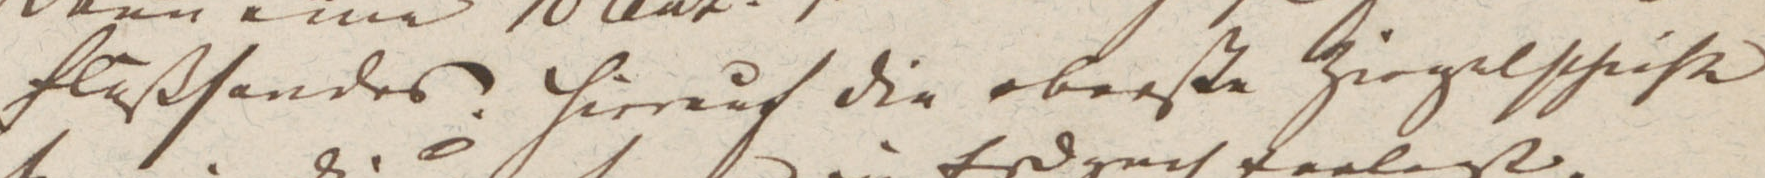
Flusssandes. Hierauf die oberste Ziegelschicht
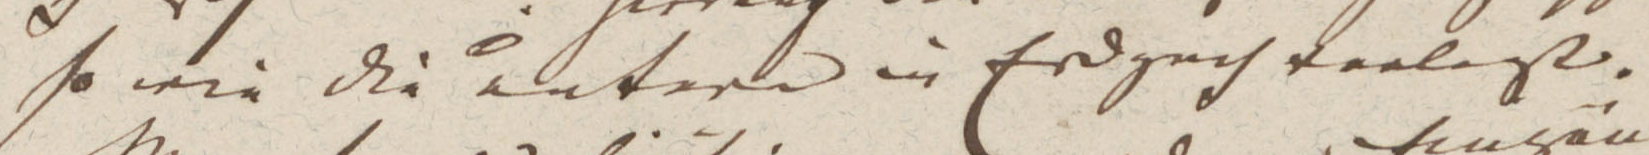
so wie die untere in Erdpech verlegt.
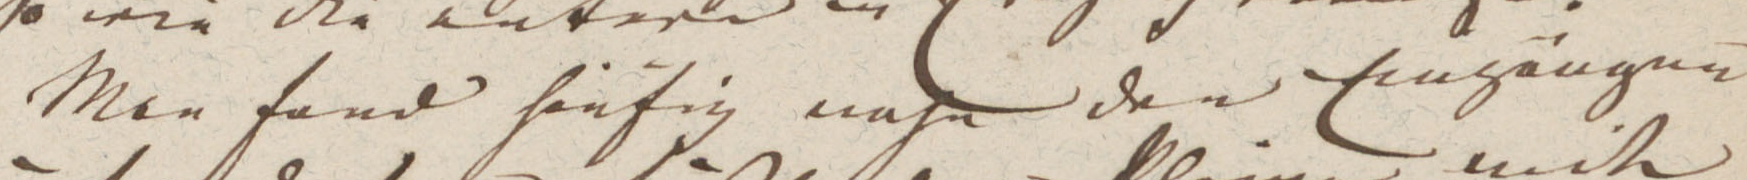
Man fand häufig nahe den Eingängen
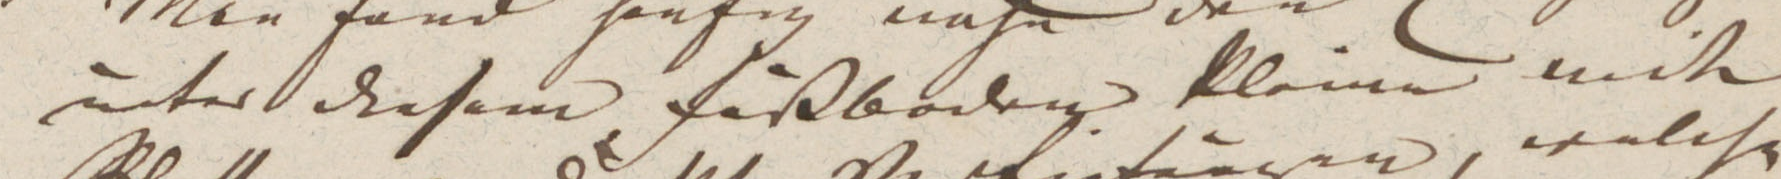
unter diesem Fussboden kleine mit
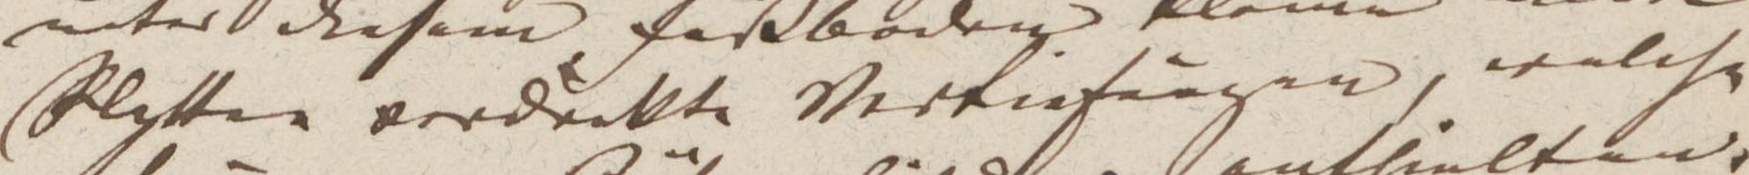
Platten verdeckte Vertiefungen, welche
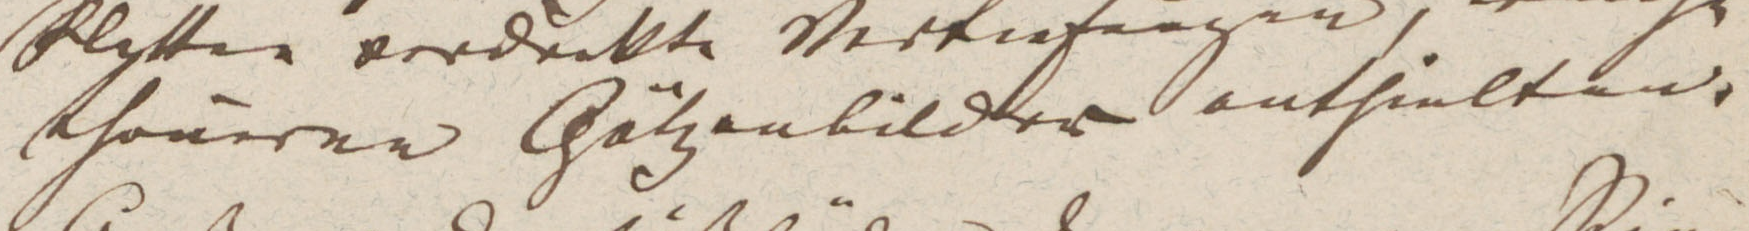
thönerne Götzenbilder enthielten.
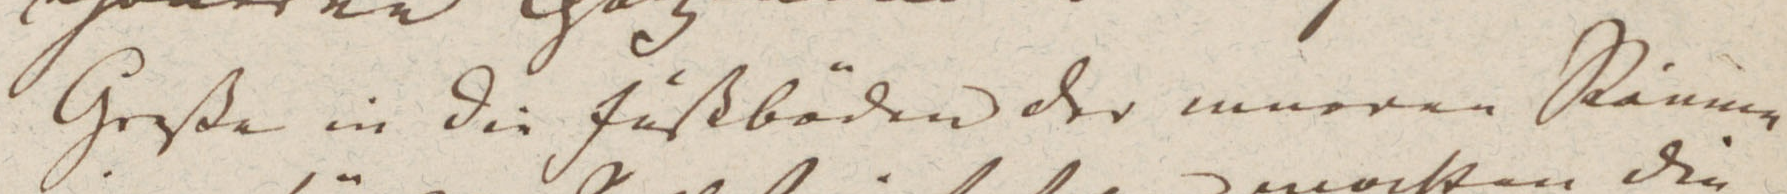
Grosse in die Fussböden der inneren Räume
